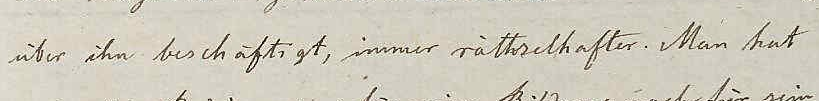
über ihn beschäftigt, immer räthselhafter. Man hat
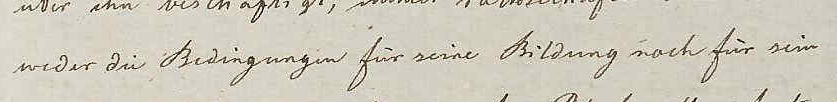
weder die Bedingungen für seine Bildung noch für sein
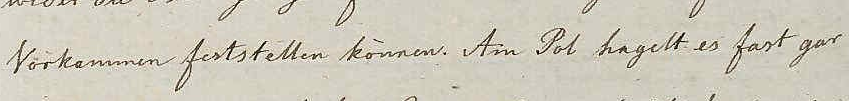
Vorkommen feststellen können. Am Pol hagelt es fast gar
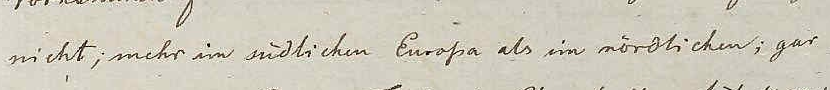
nicht; mehr im südlichen Europa als im nördlichen; gar
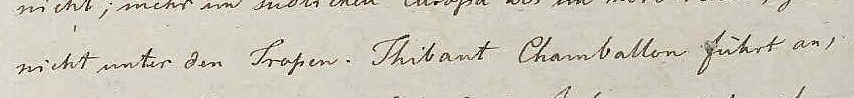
nicht unter den Tropen. Thibaut Chamballon führt an,
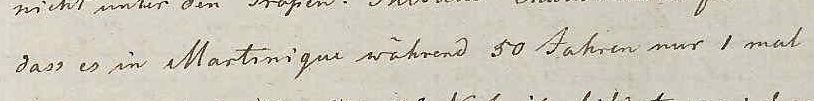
dass es in Martinique während 50 Jahren nur 1 mal
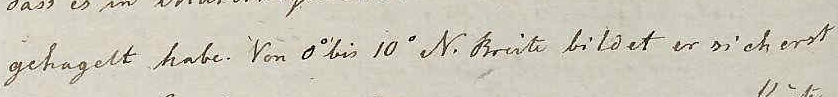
gehagelt habe. Von 0° bis 10° N. N.-Breite bildet er sich erst
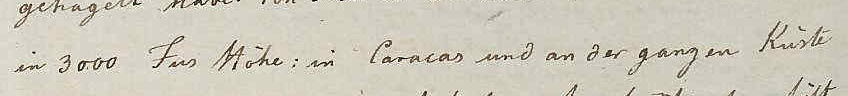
in 3000 Fus Höhe: in Caracas und an der ganzen Küste
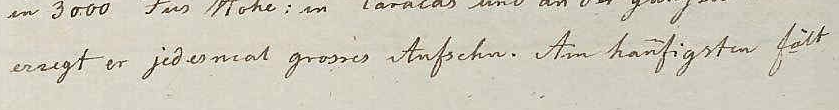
erregt er jedesmal grosses Aufsehn. Am häufigsten fält
